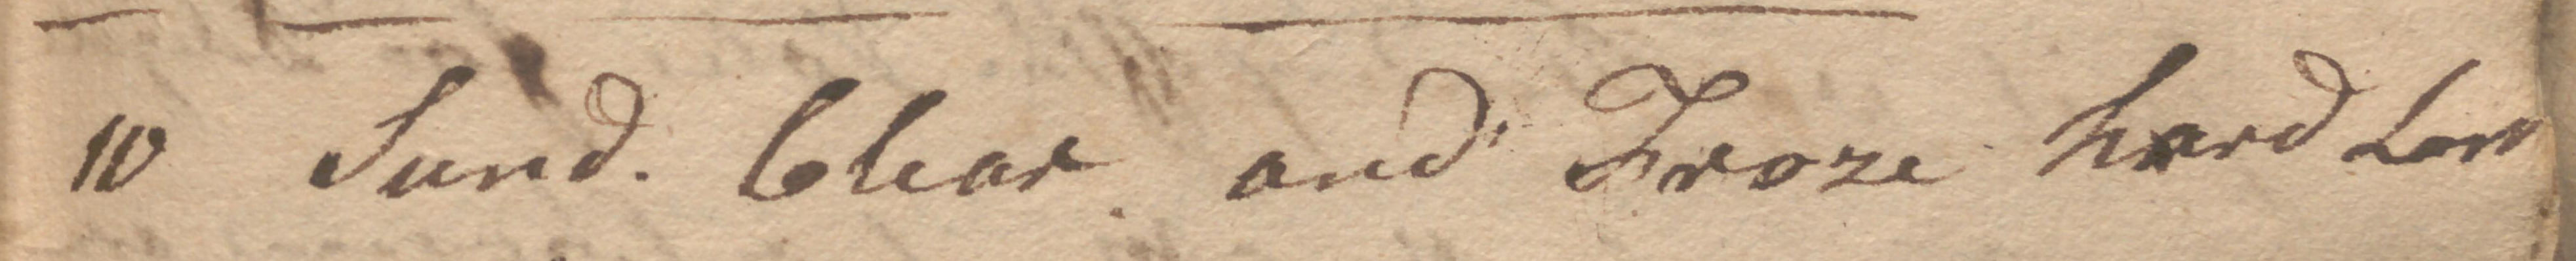10 Sund. Clear and Froze hard Lost
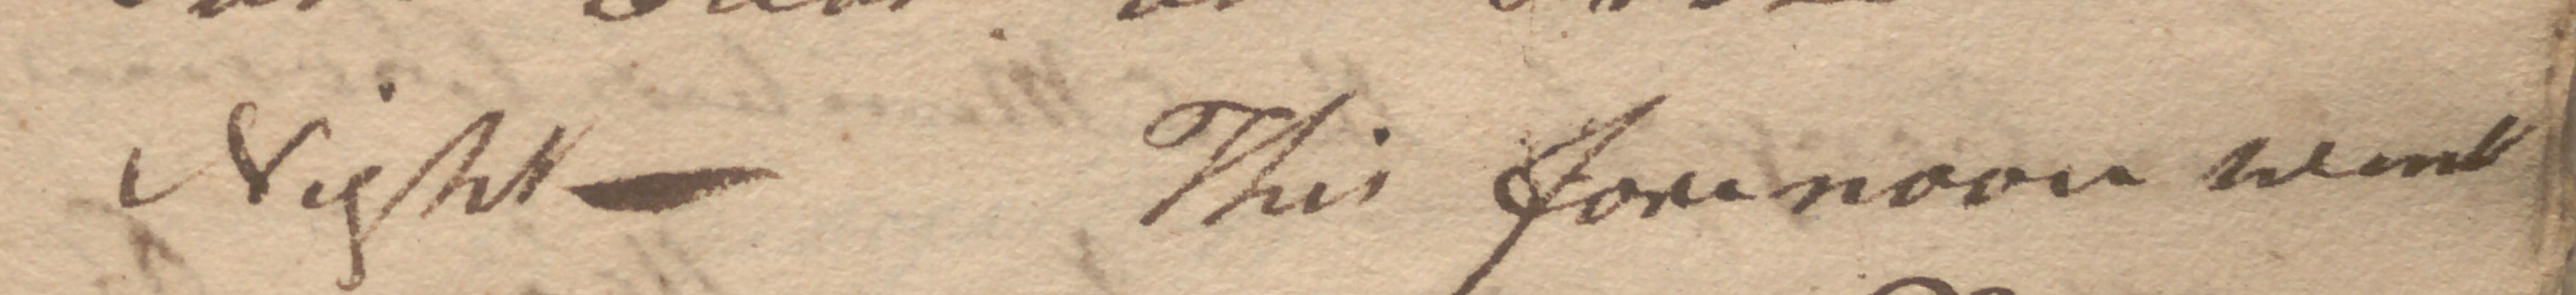Night- This forenoon went
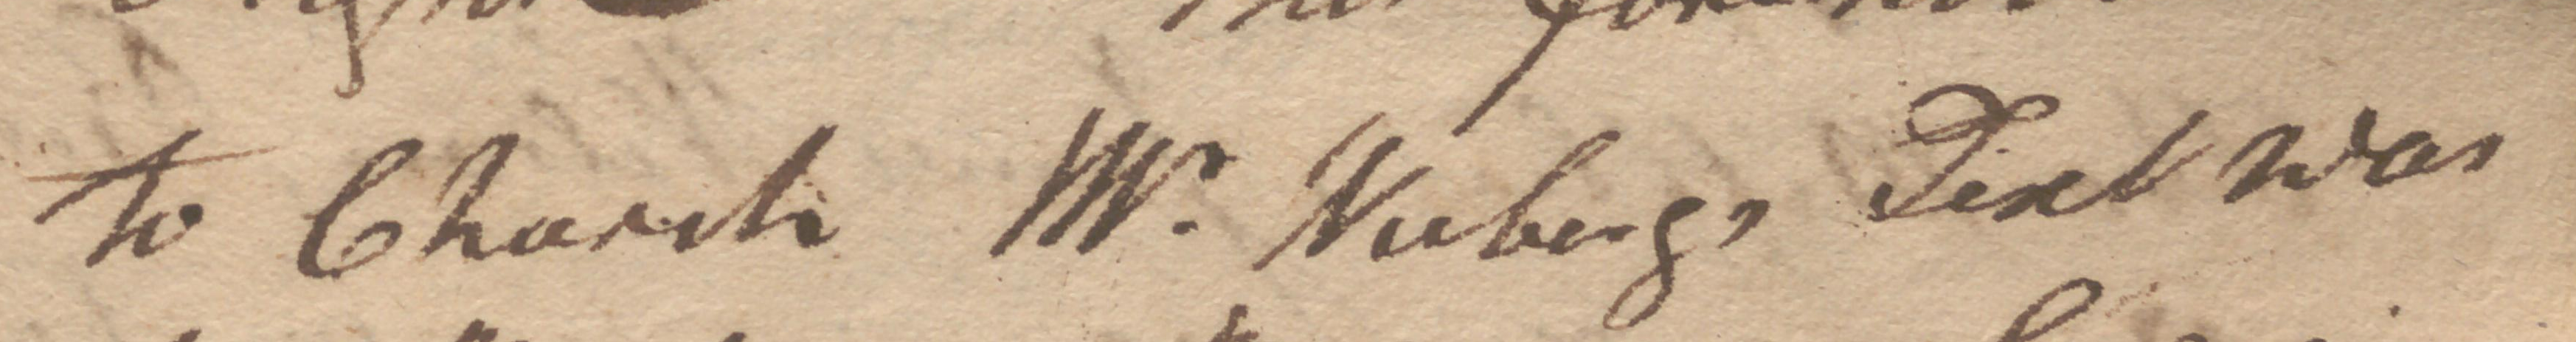to Church M^r. Weibergs Text was
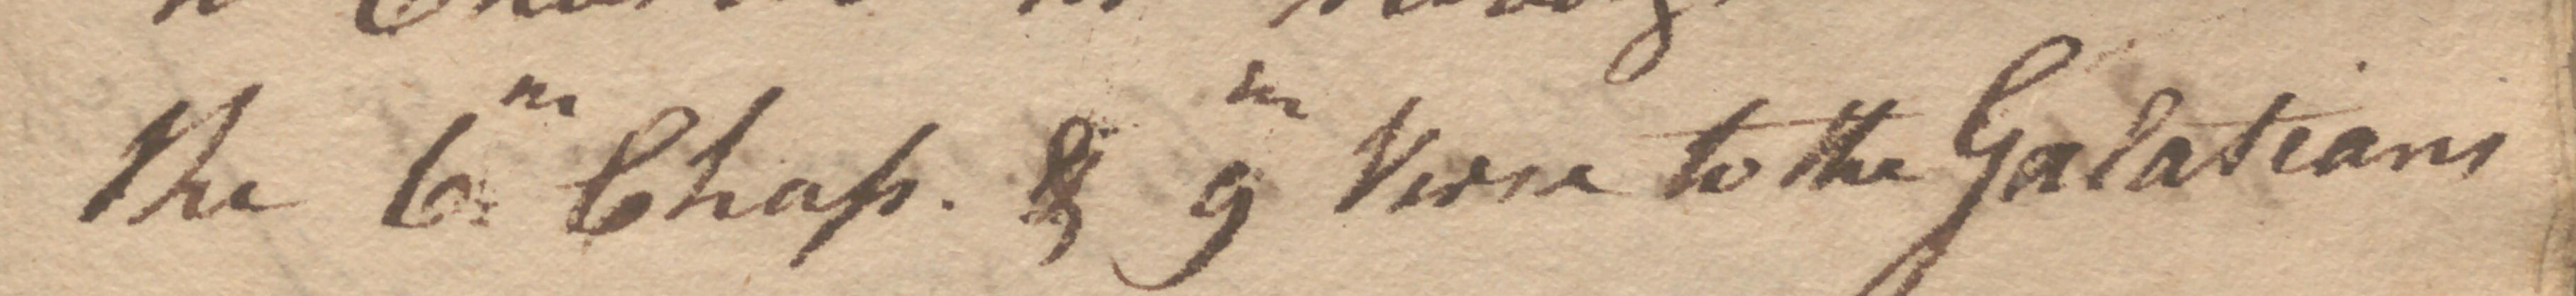the 6^th. Chap. & 9^th Verse to the Galatians
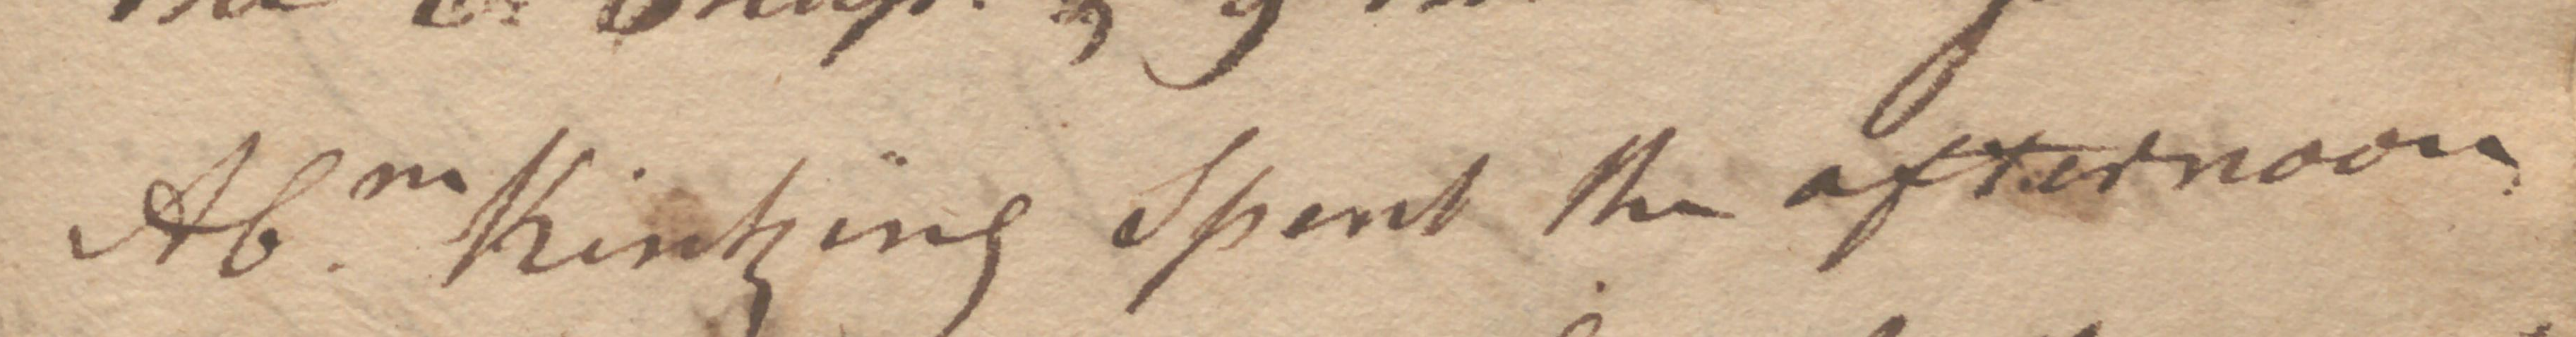Ab^m. Kintzing spent the afternoon
